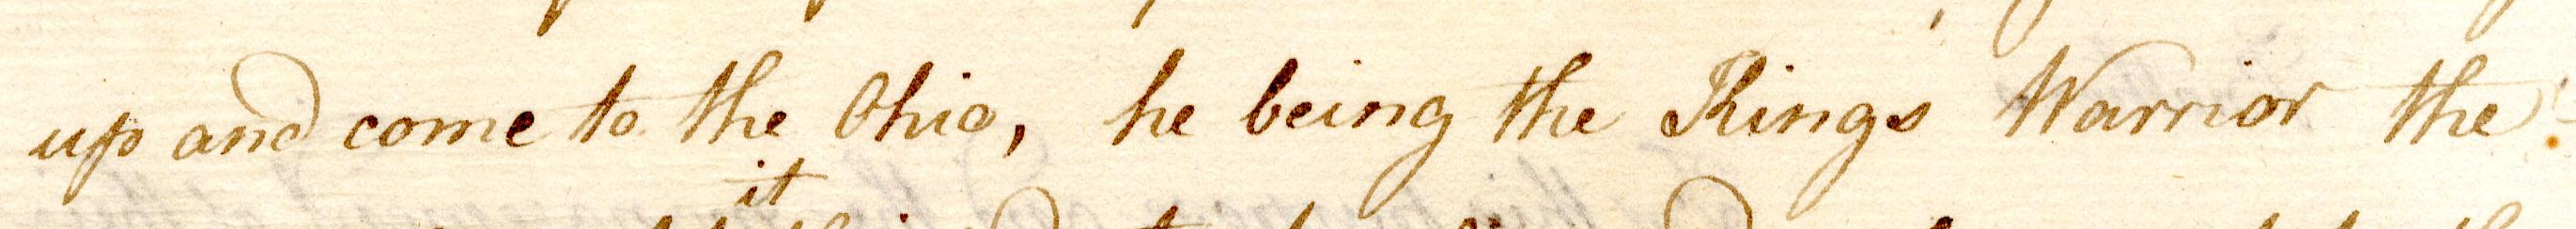up and come to the Ohio, he being the King's Warrior the
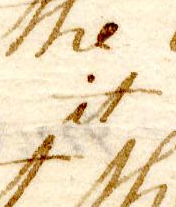it
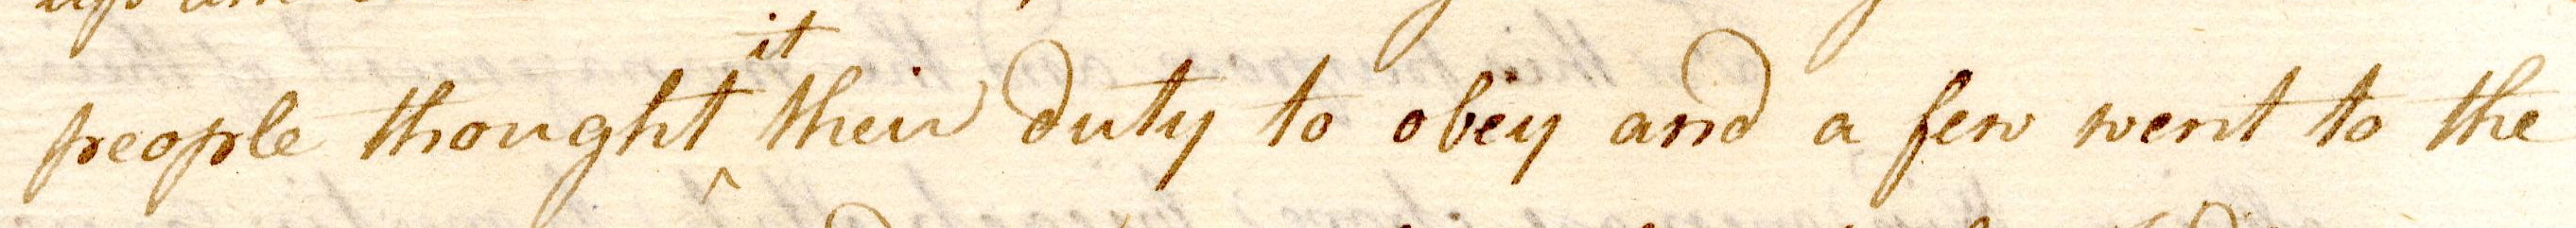people thought their duty to obey and a few went to the
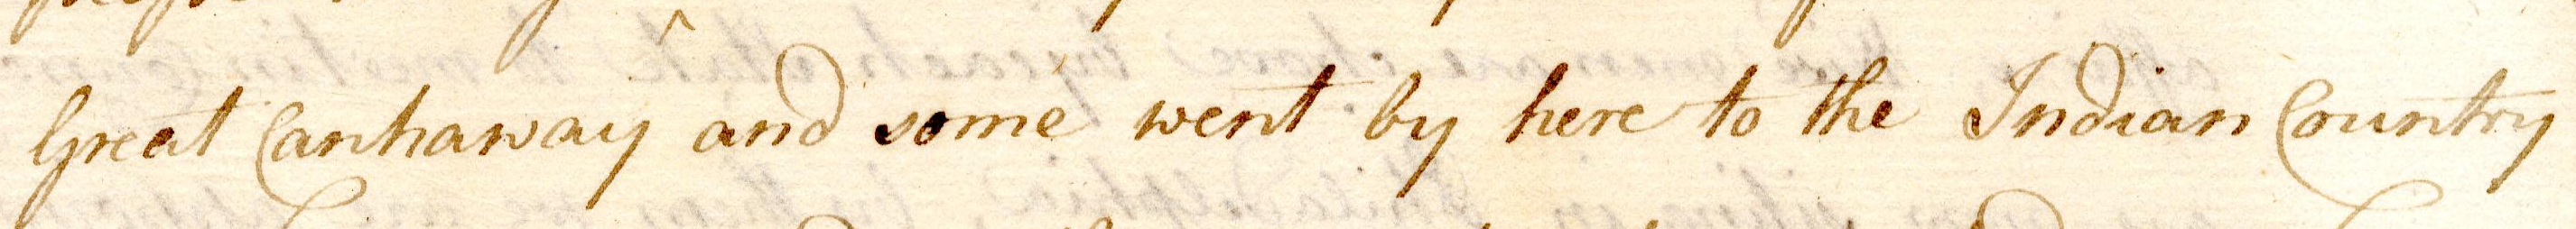Great Canhaway and some went by here to the Indian Country
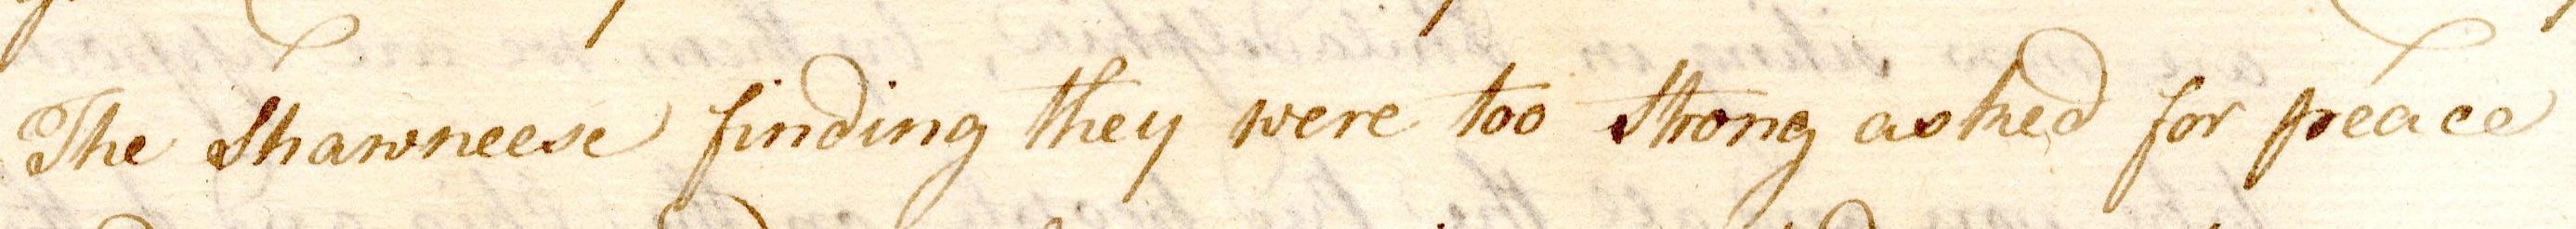The Shawneese finding they were too Strong asked for peace
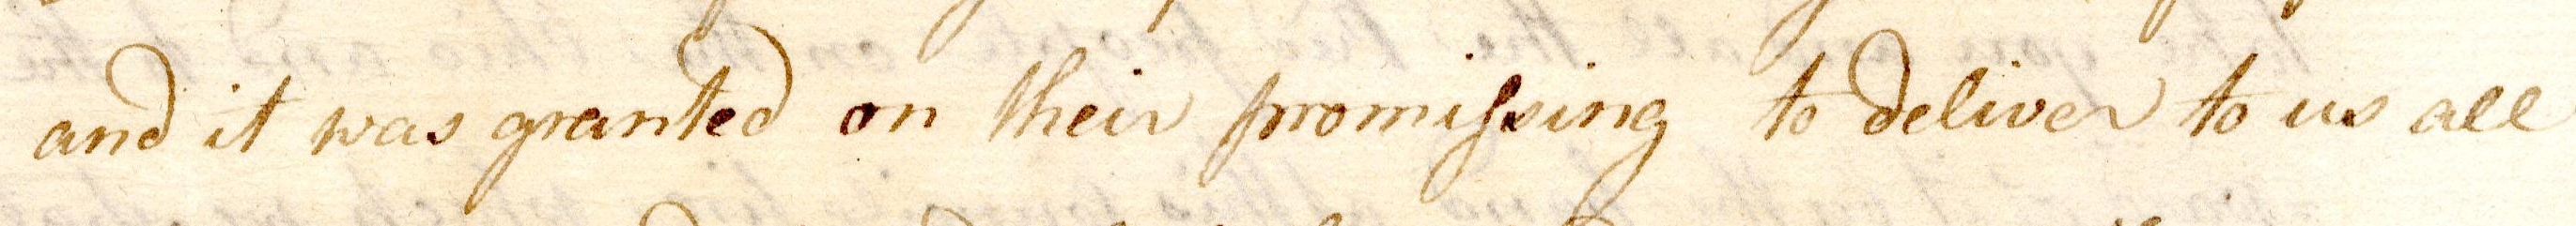and it was granted on their promissing to deliver to us all
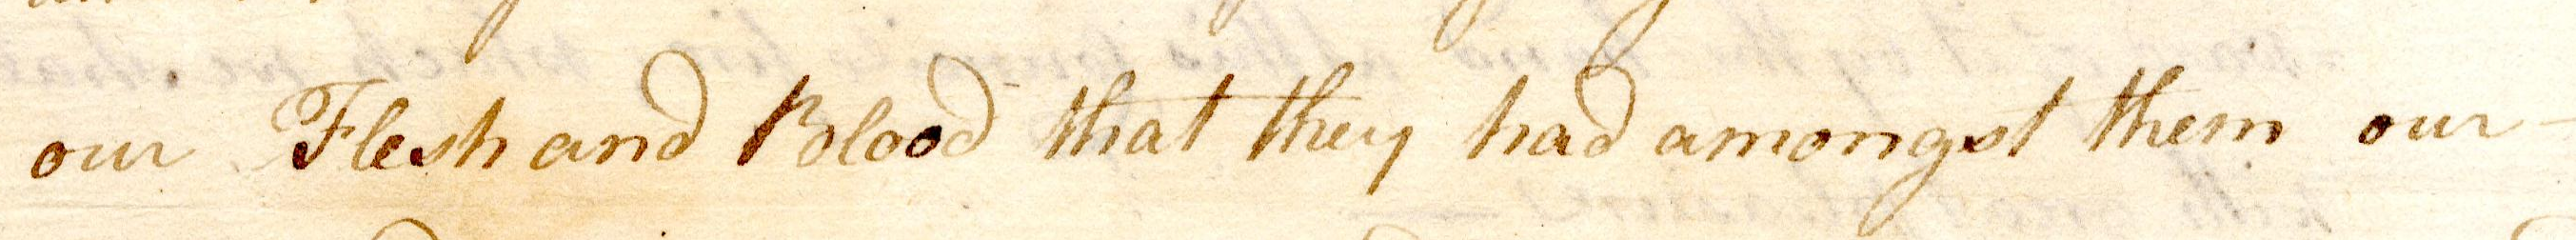our Flesh and Blood that they had amongst them our
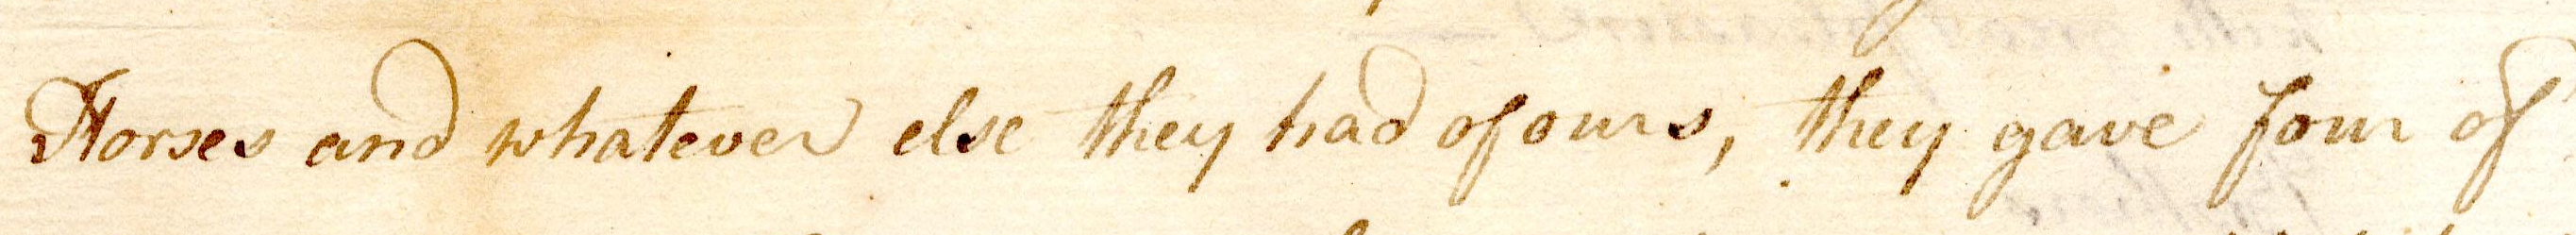Horses and whatever else they had of ours, they gave four of
